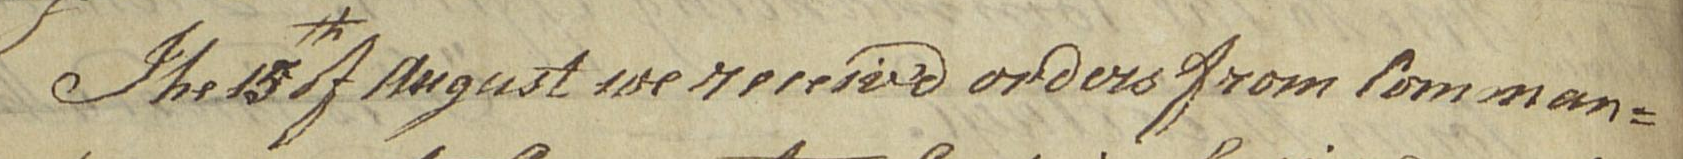The 15^th of August we receiv'd orders from Comman-
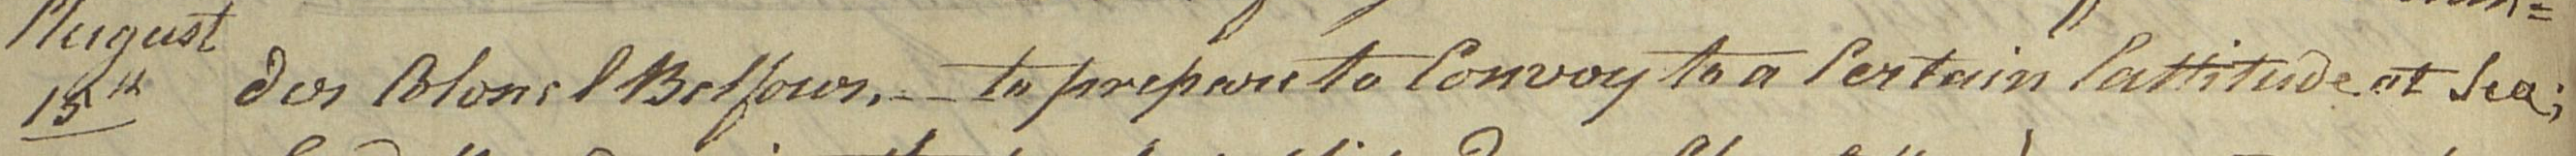15^th -der Alons Belfour, to prepare to Convoy to a Certain lattitude at sea
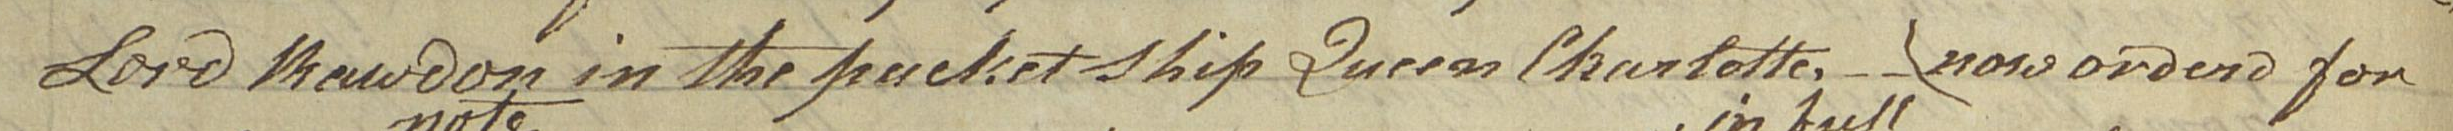Lord Rawdon in the packet Ship Queen Charlotte, (now orderd for
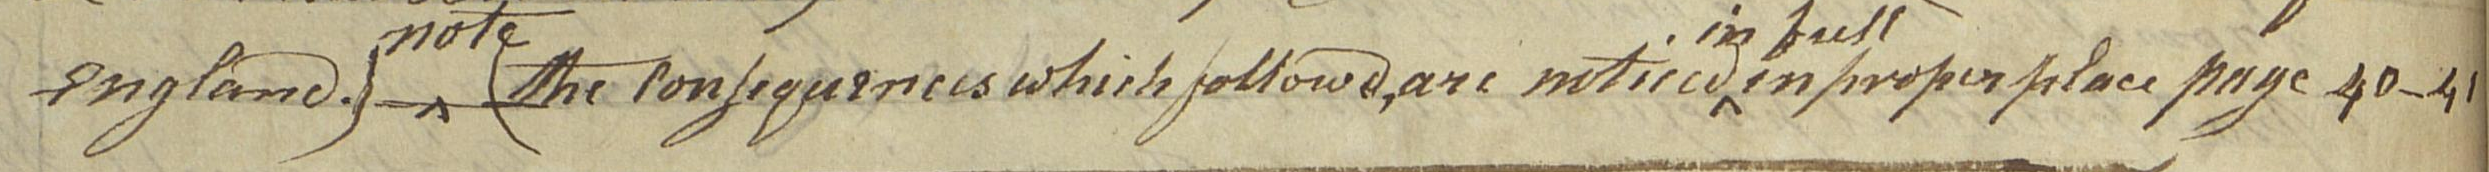England.) ^ (The consequences which followd, are noticed ^ in proper place page 40-41
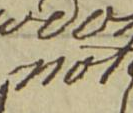note
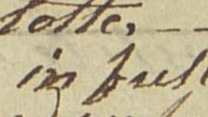in full
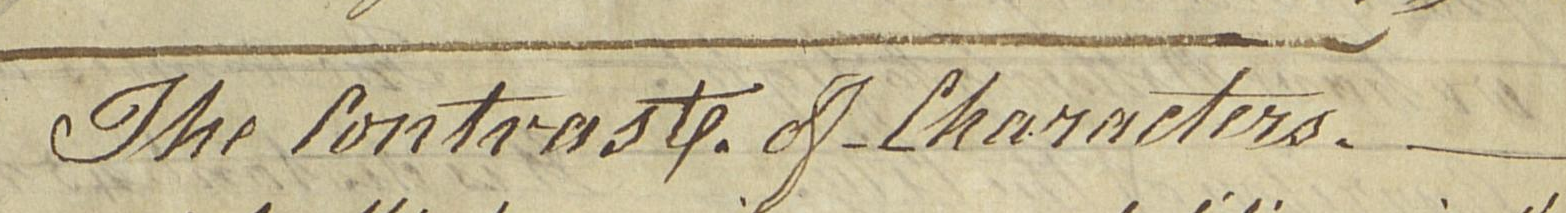The contrast of Characters.
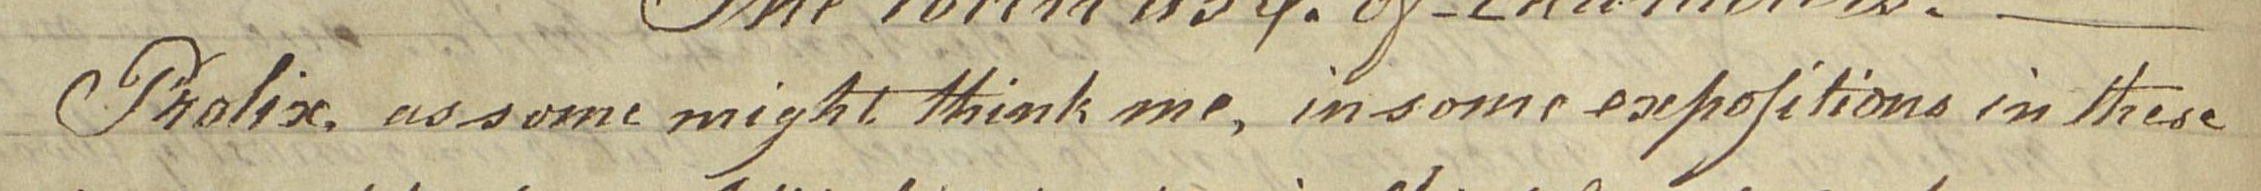Prolix as some might think me, in some expositions in these
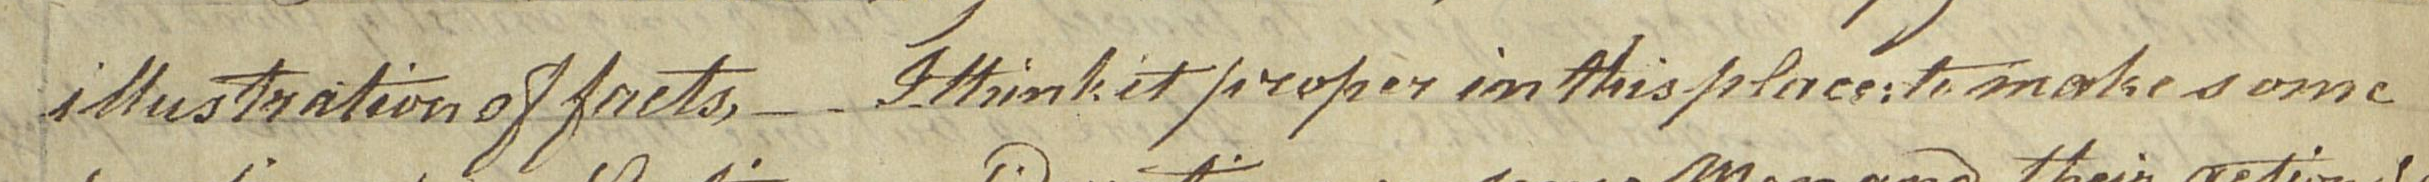illustration of facts, I think it proper in this place; to make some
